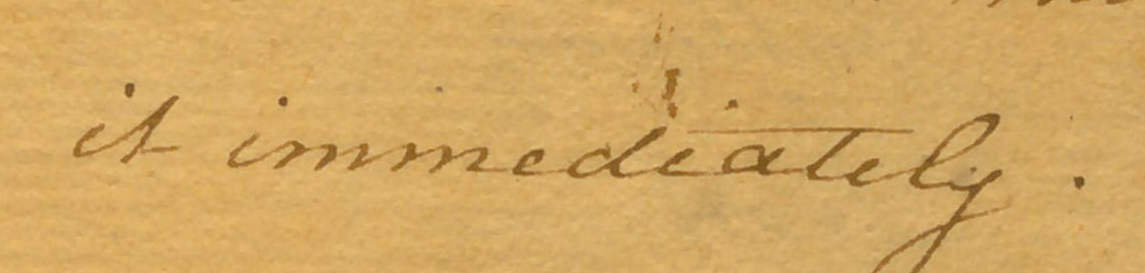it immediately.
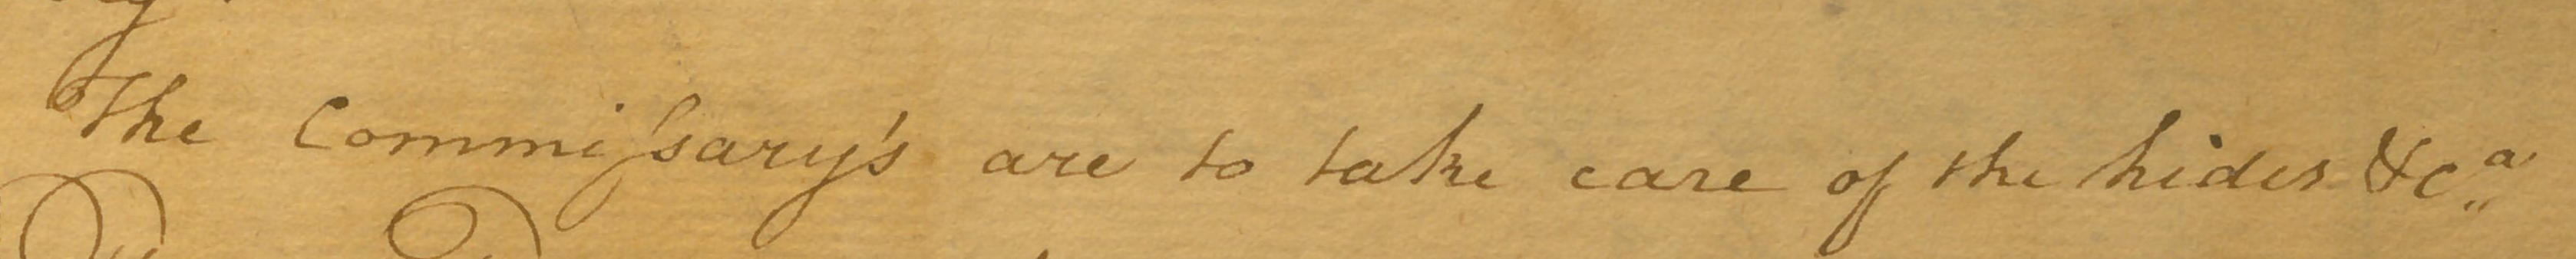The Commissary's are to take care of the hides &c^a.
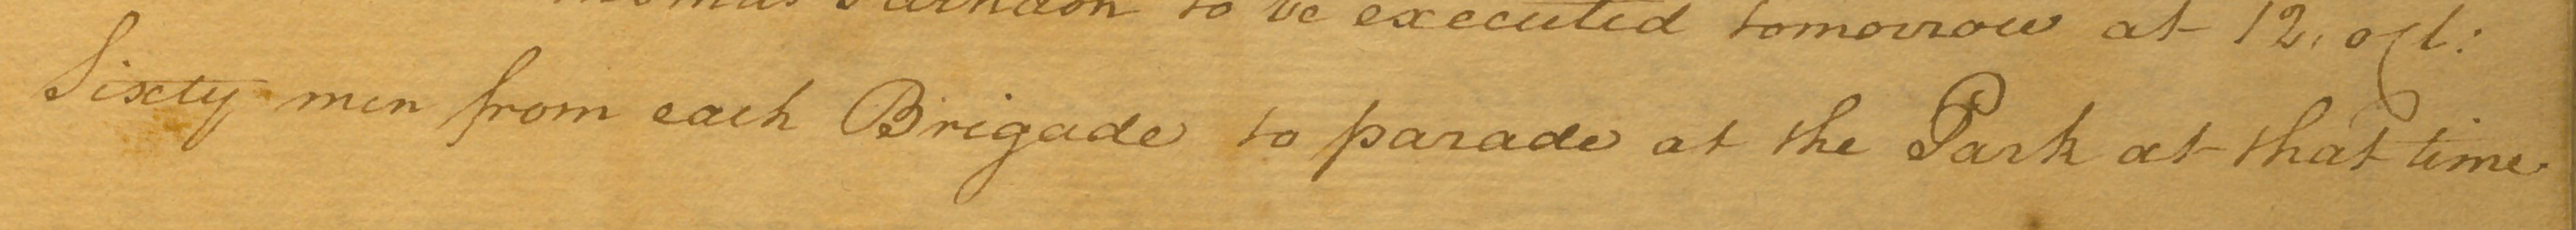Sixty men from each Brigade to parade at the Park at that time.
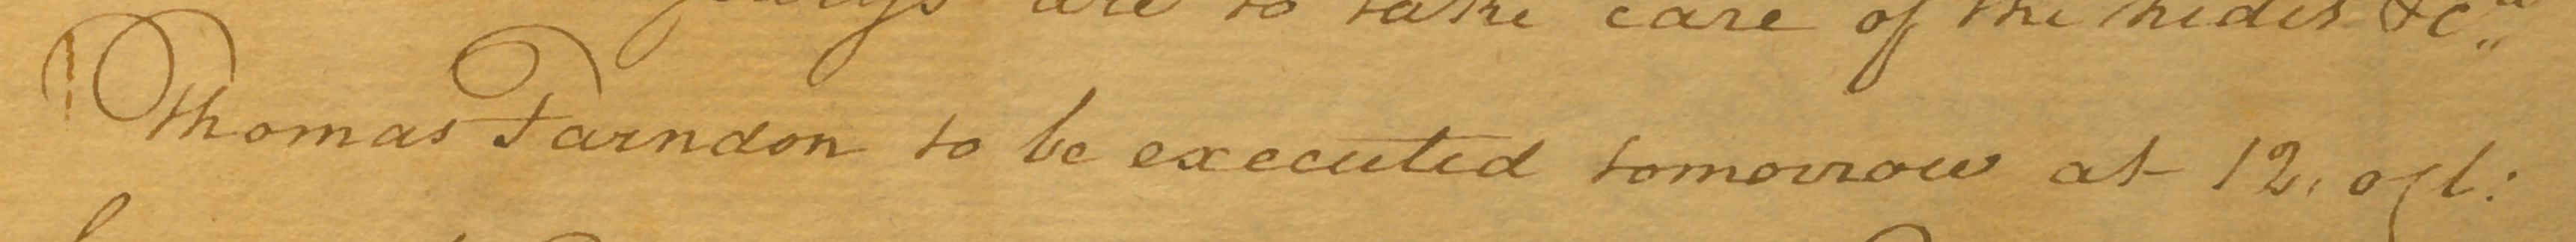Thomas Farndon to be executed tomorrow at 12. oCl:
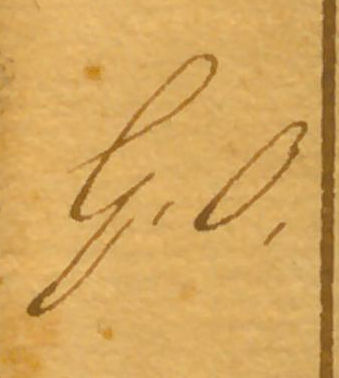G.O.
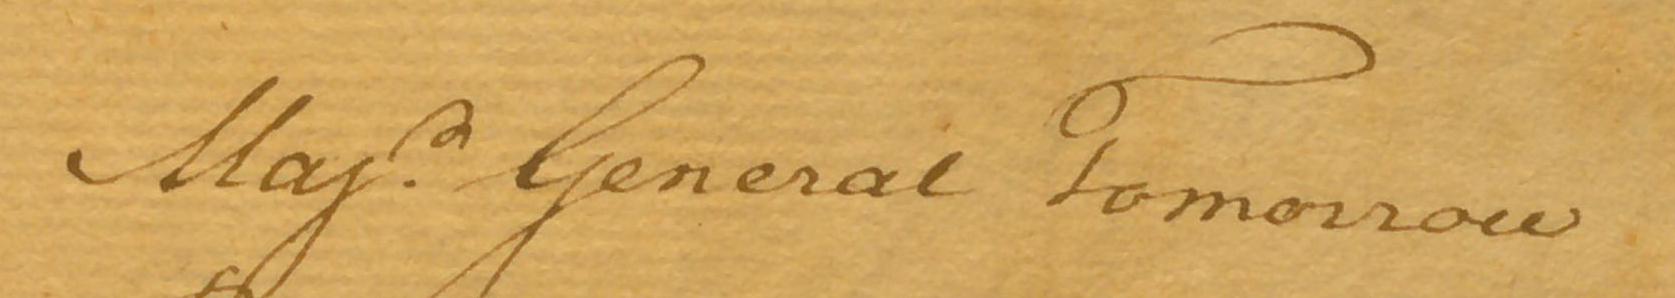Maj^r. General Tomorrow
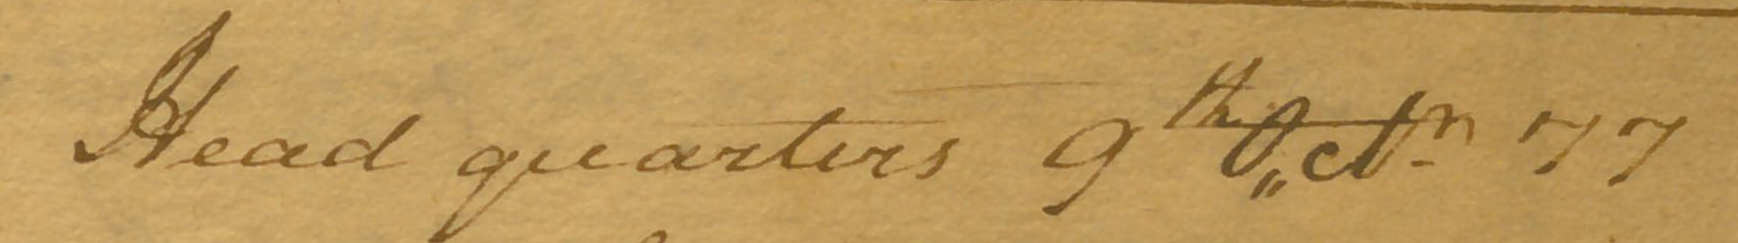Head quarters 9^th. Oct^r. 77
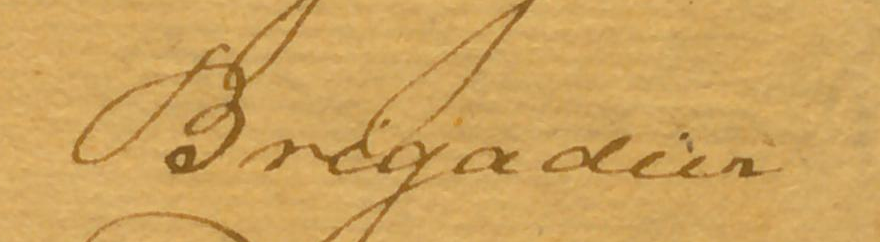Brigadier
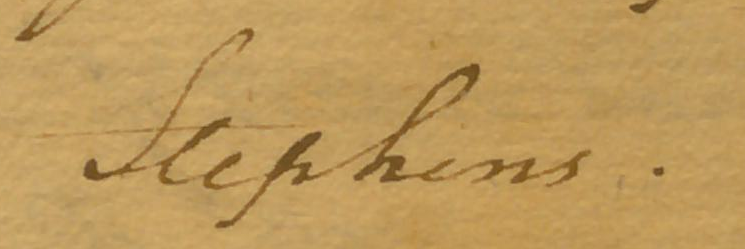Stephens.
